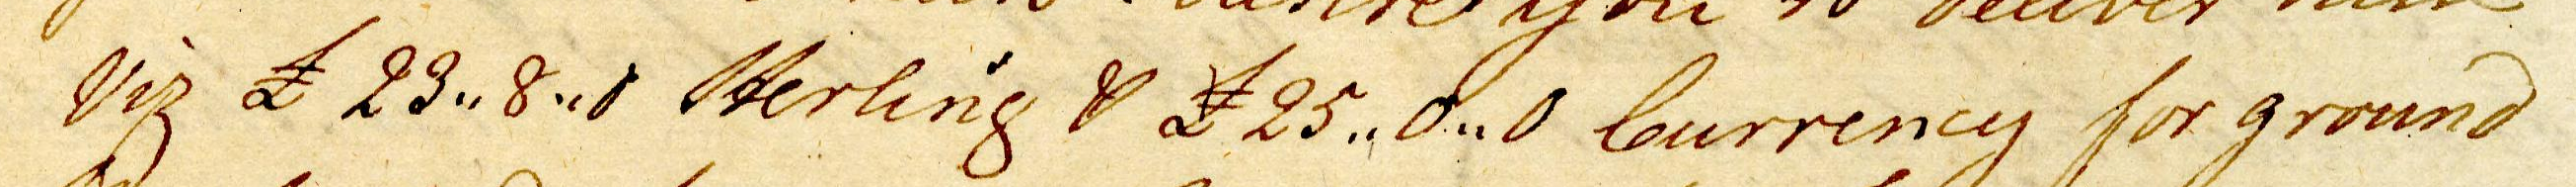Viz £23..8..0 Sterling & £25..0..0 Currency for ground
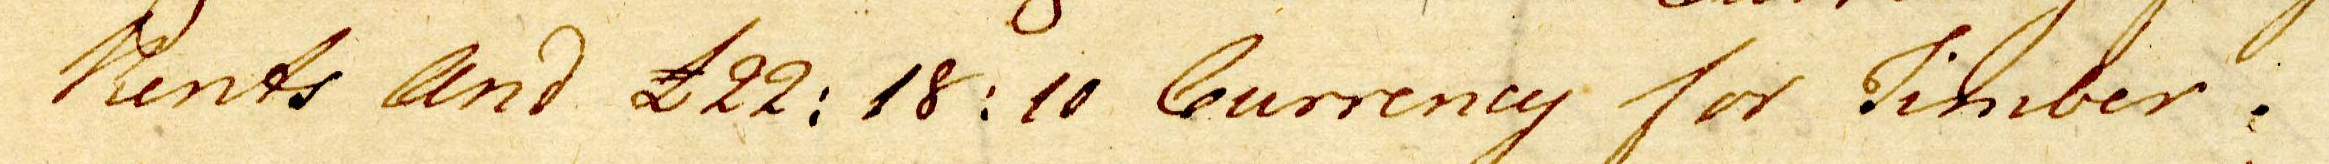Rents and £22..18..10 Currency for Timber.
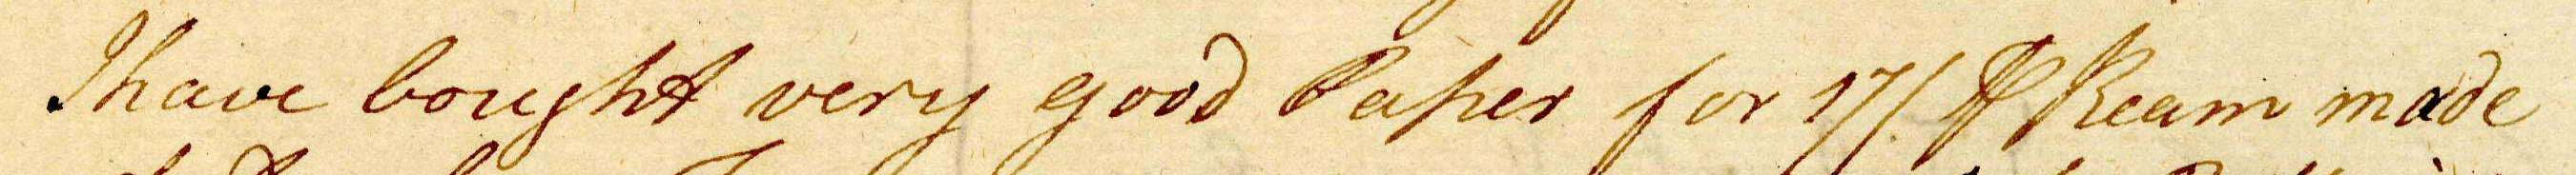I have bought very good Paper for 17s. per Ream made
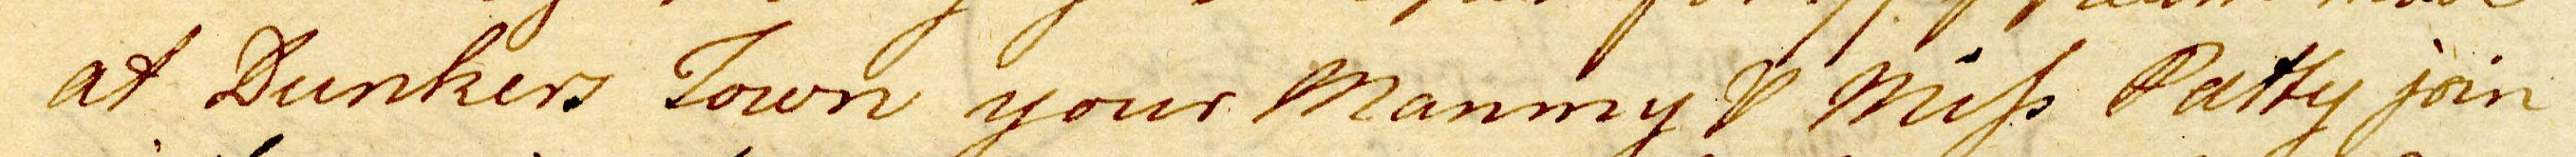at Dunkers Town your Mammy & Miss Patty join
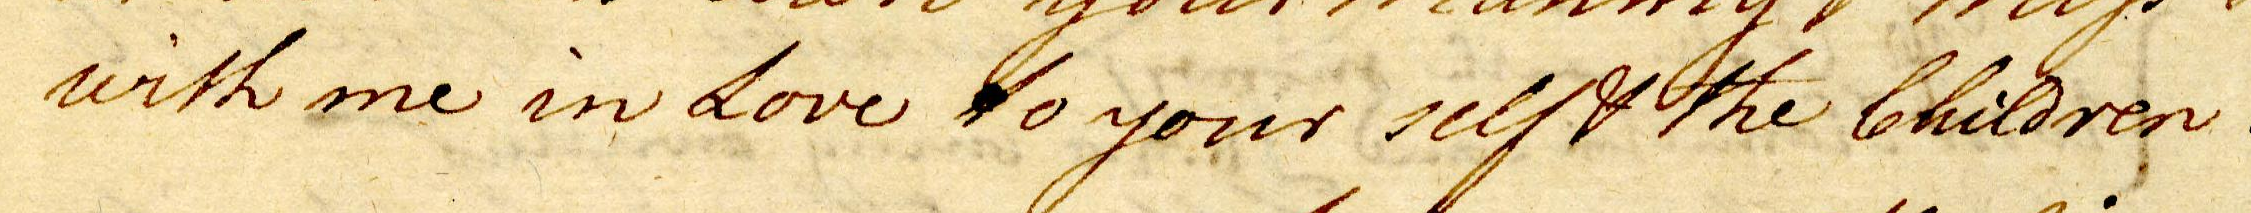with me in Love to your self & the Children
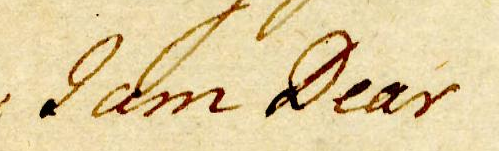I am Dear
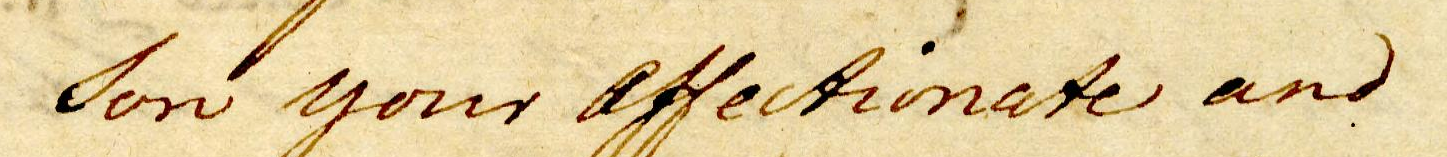Son your Affectionate and
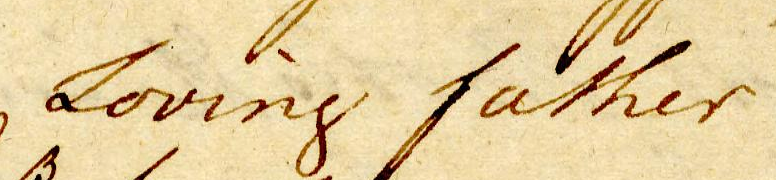Loving father
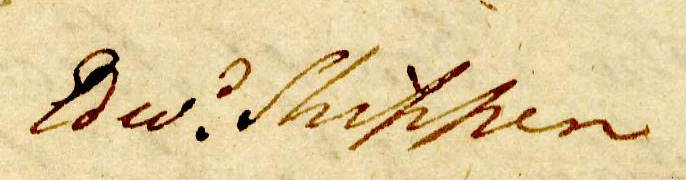Edw^d. Shippen
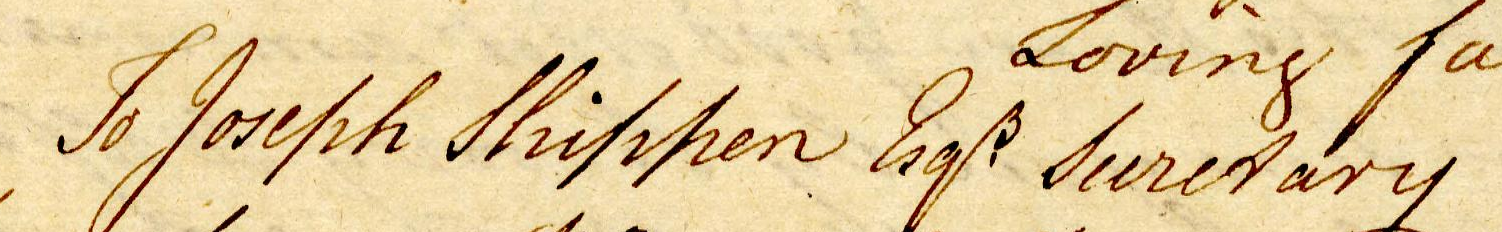To Joseph Shippen Esq^r. Secretary
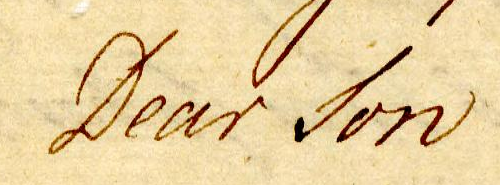Dear Son
